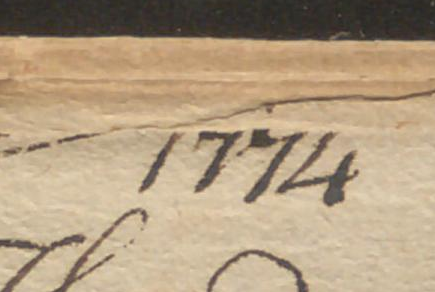1774
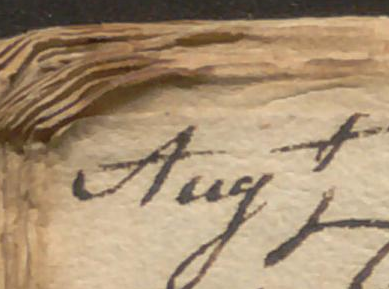Aug^t
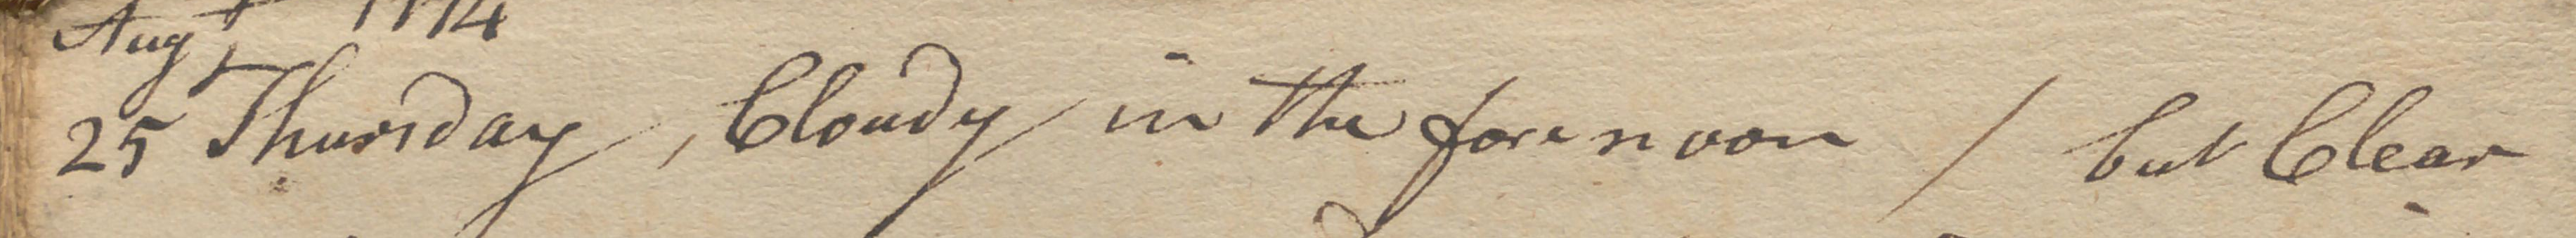25 Thursday, Cloudy in the forenoon / but Clear
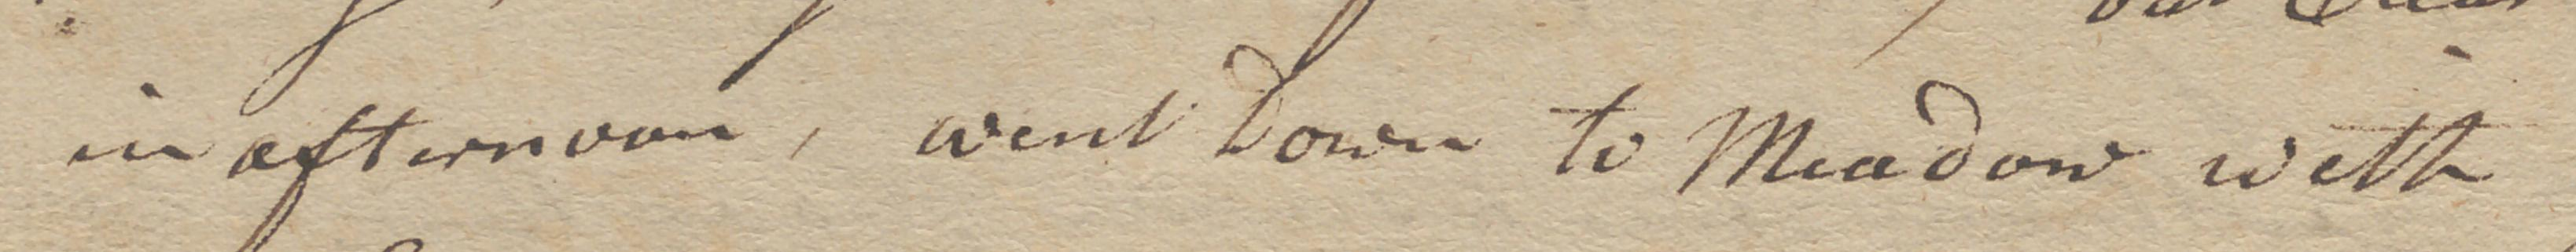in afternoon, went Down to Meadow with
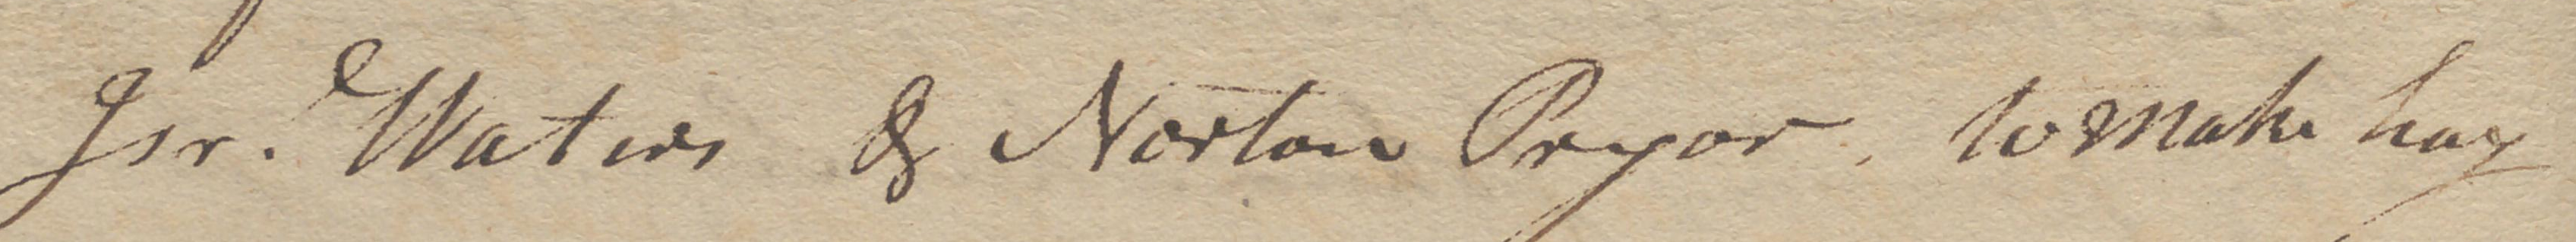Isr^l. Waters & Norton Pryor to make hay
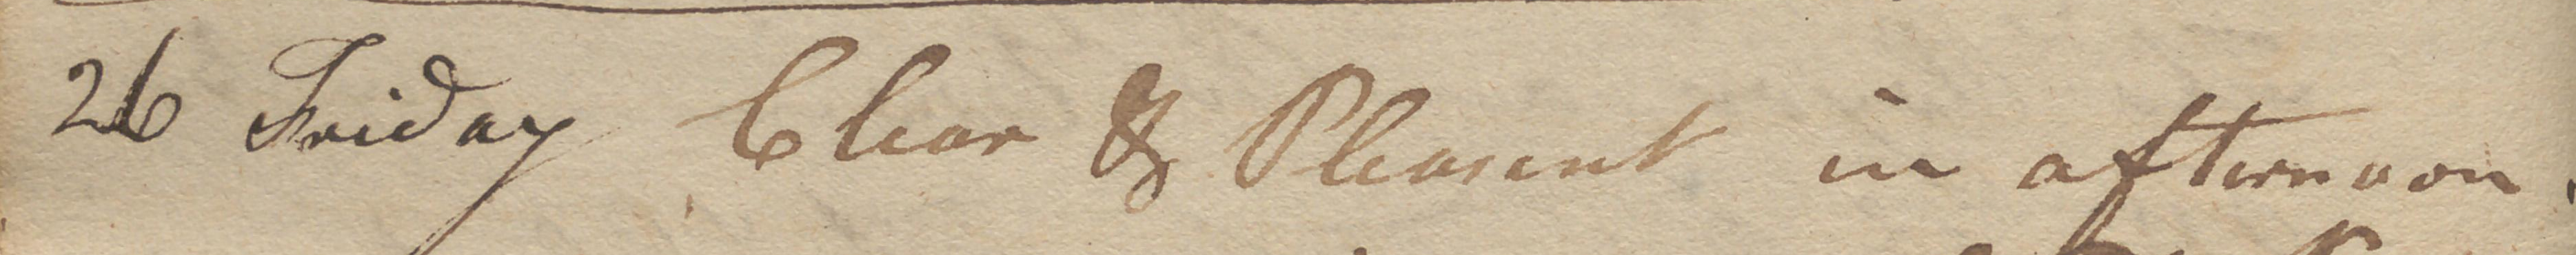26 Friday Clear & Pleasent in afternoon
